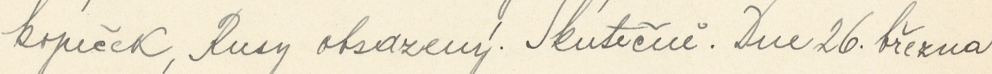kopeček, Rusy obsazený. Skutečně. Dne 26. března
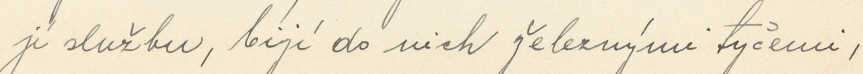jí službu, bijí do nich železnými tyčemi,
